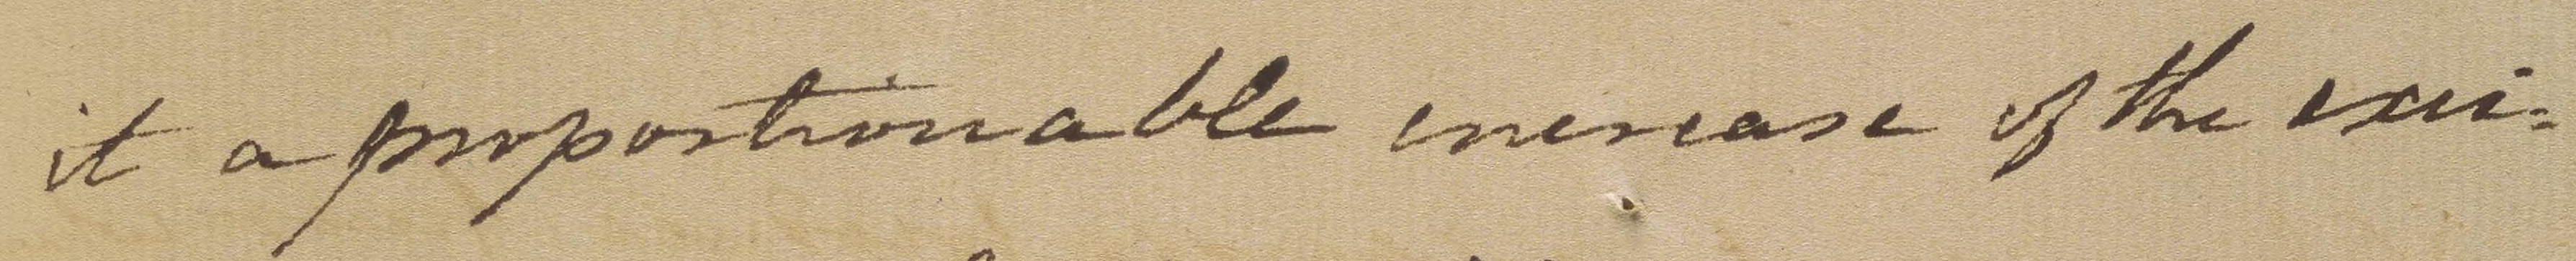it a propositionable encrease of the exci-
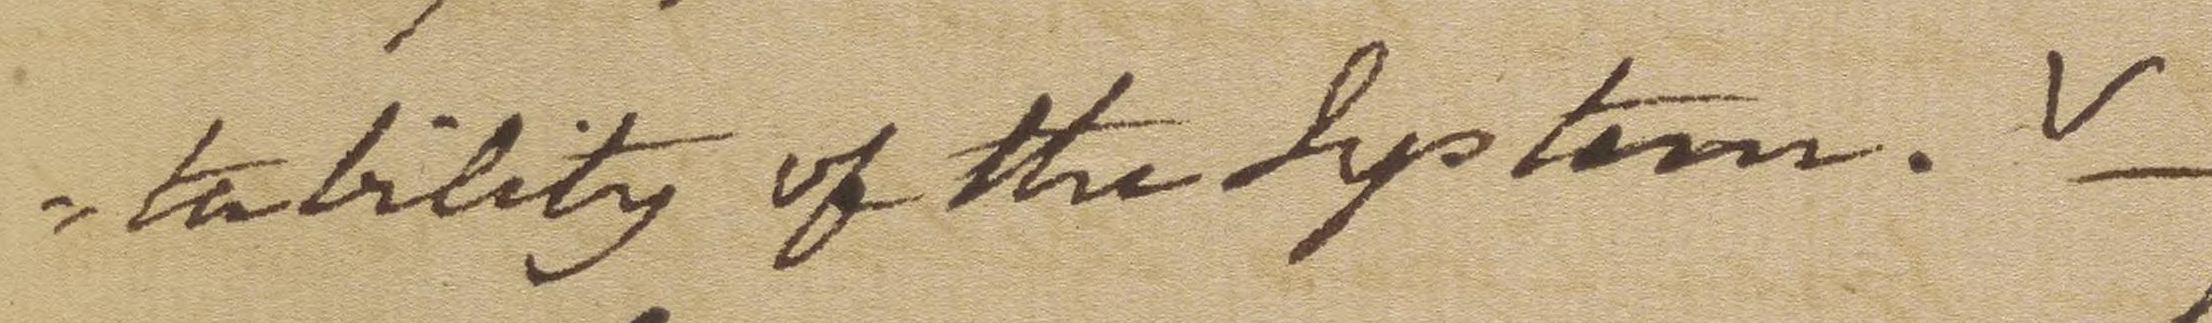-tability of the system. V
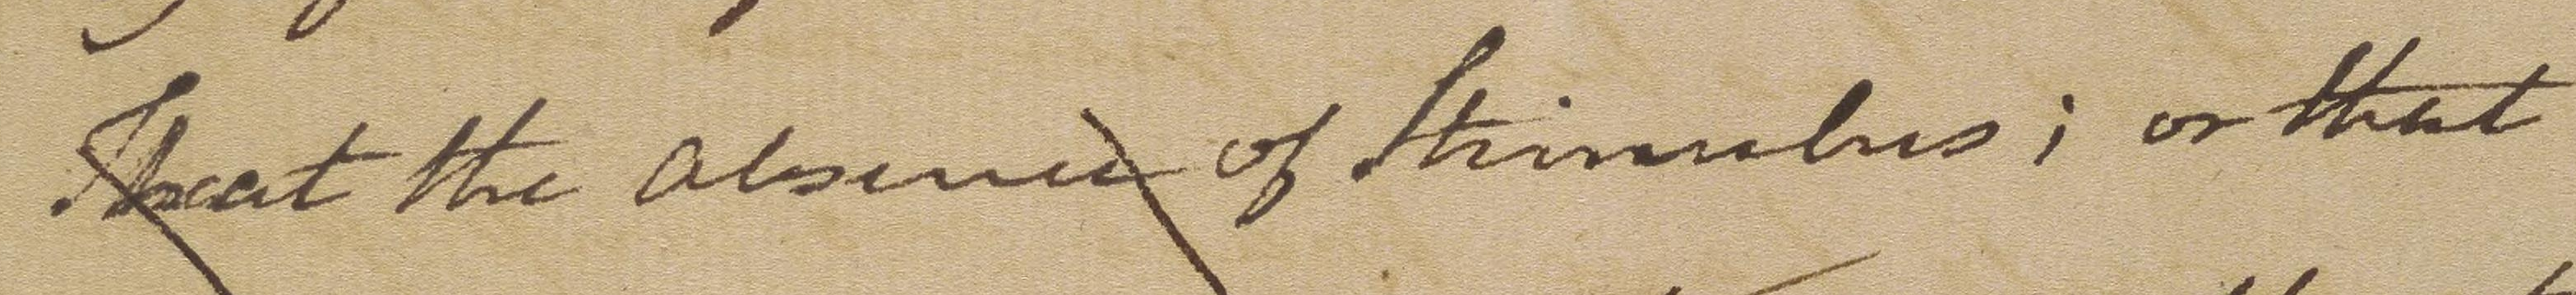That the absence of Stimulus; or that
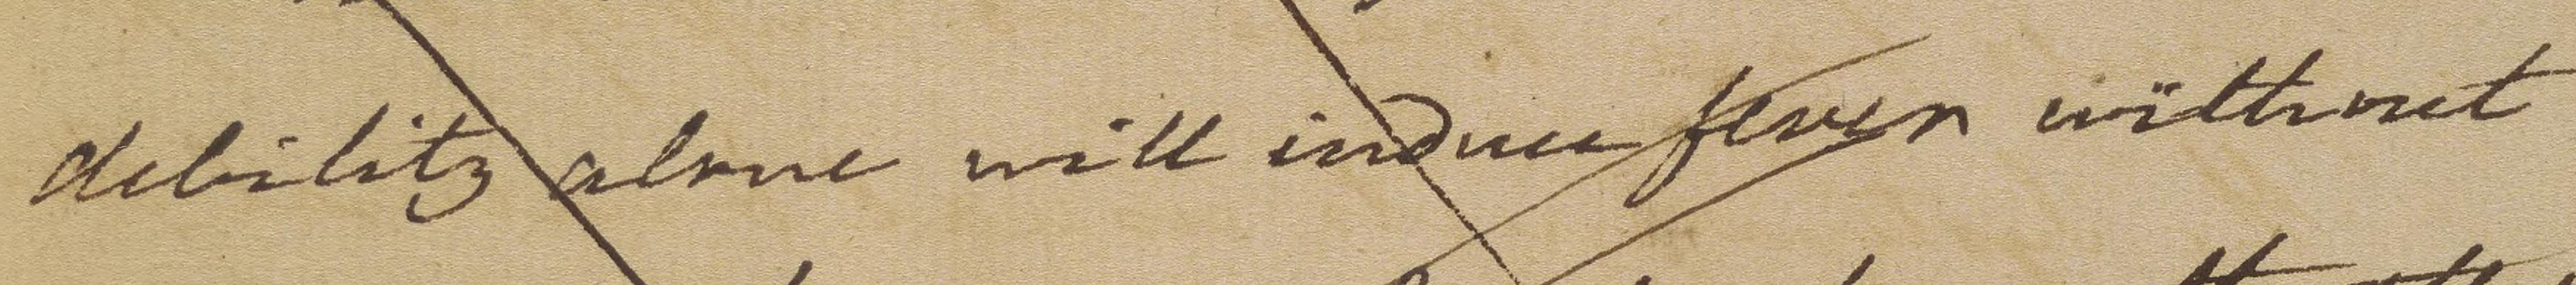debility alone will induce fever without
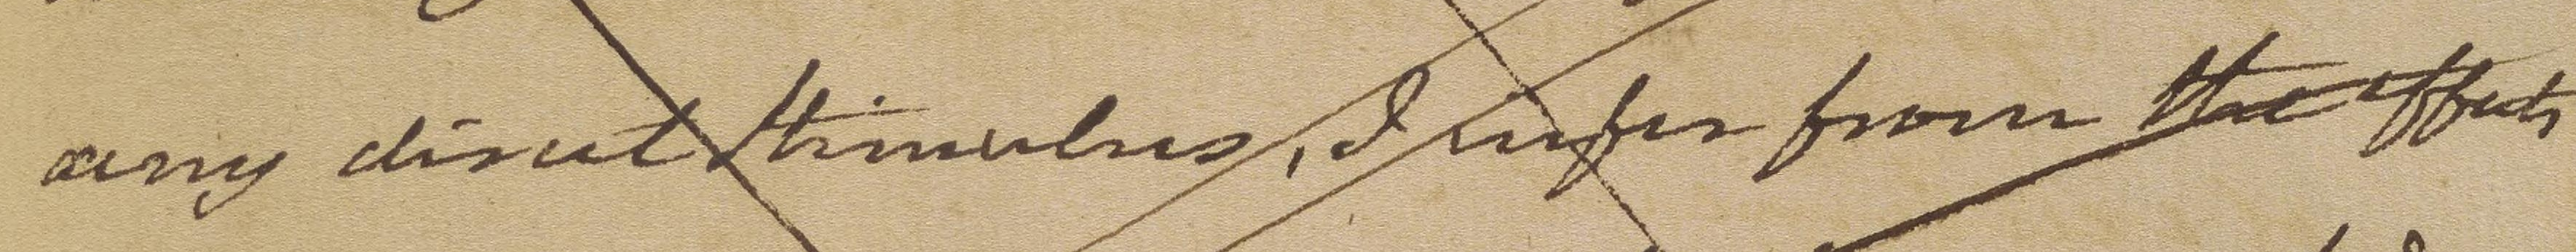any direct Stimulus, I infer from the effects
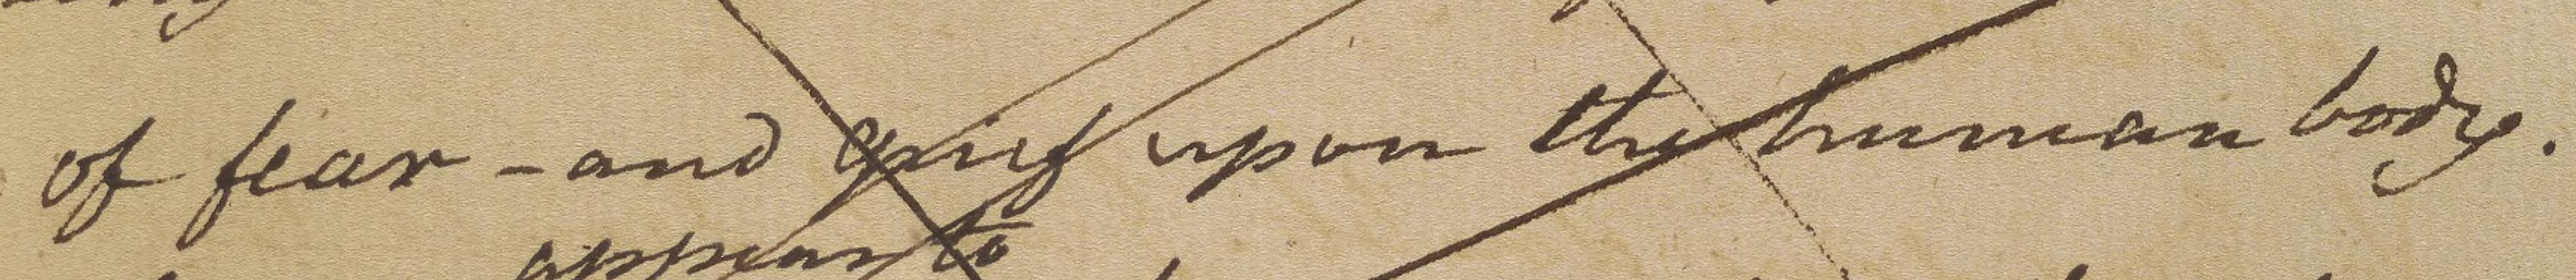of fear- and grief upon the human body
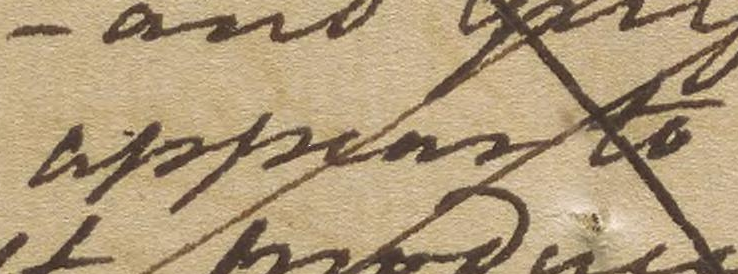appear to
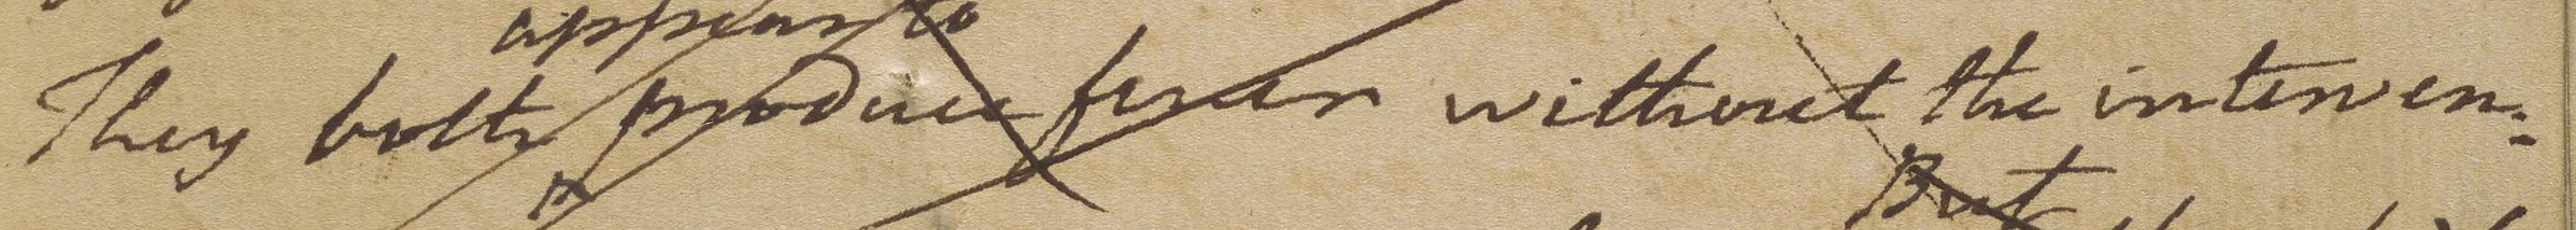They both ^ produce fever without the interven-
